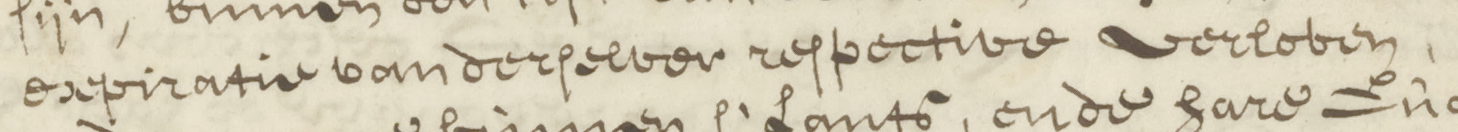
expiratie van derselver respective verloven,
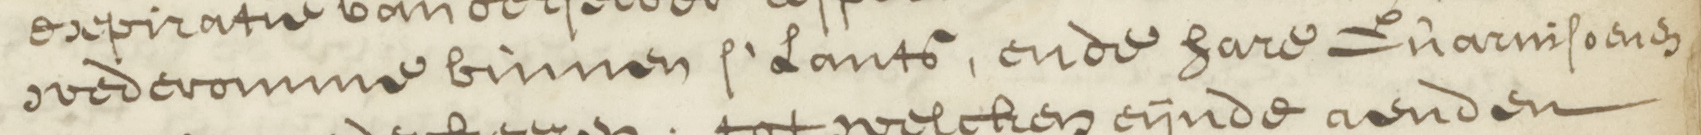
wederomme binnen s‛ Lants, ende hare Guarnisoenen
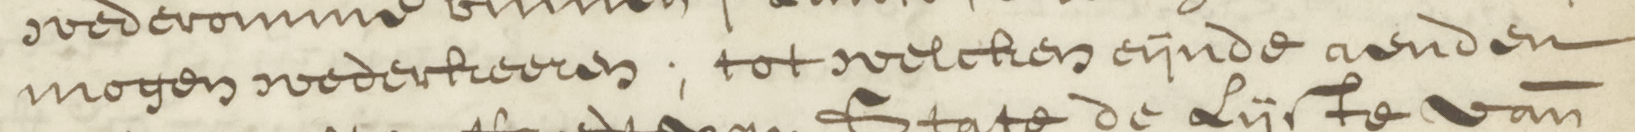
mogen wederkeeren; tot welcken eijnde aenden
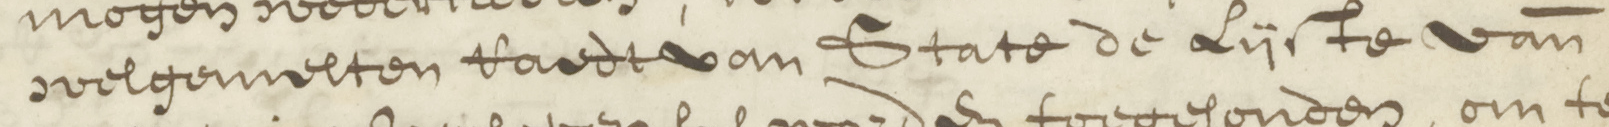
welgemelten Raedt van State de Lijste van
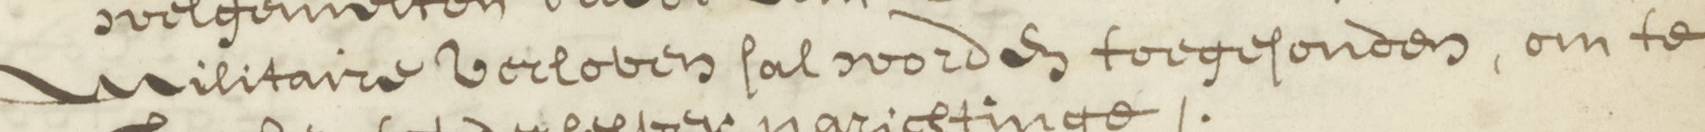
Militaire verloven sal worden toegesonden, om te
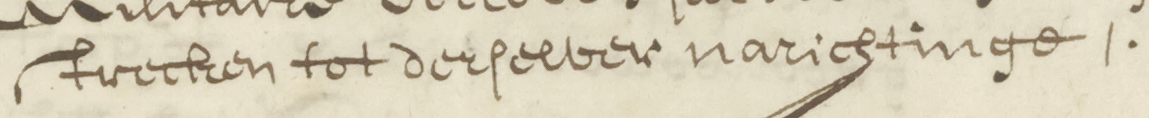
strecken tot derselver narichtinge.
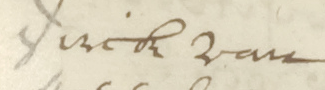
Dirck van
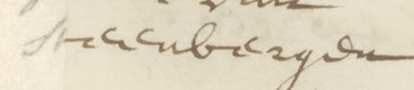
Steenbergen
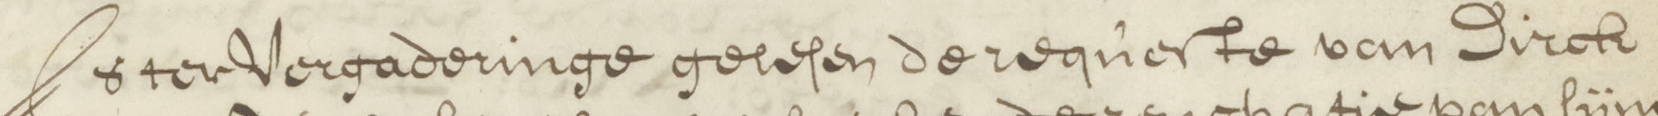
Is ter Vergaderinge gelesen de requeste van Dirck
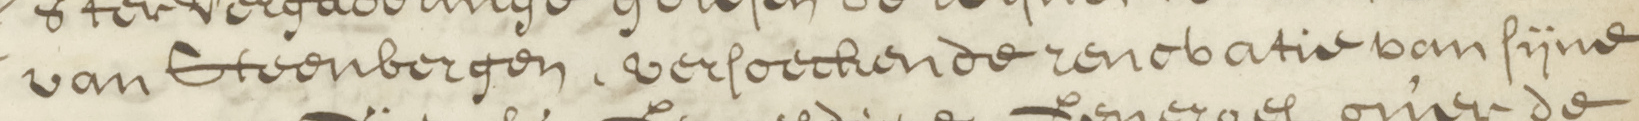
van Steenbergen, versoeckende renovatie van sijne
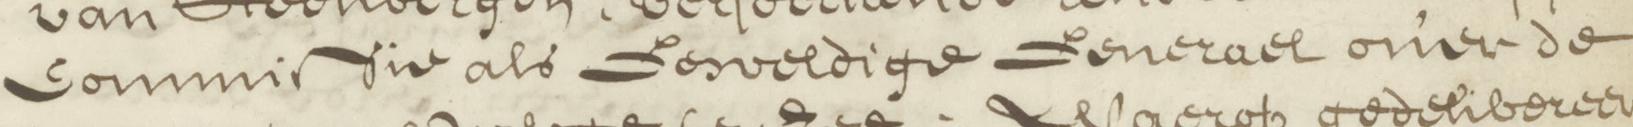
Commissie als Geweldige Generael ouer de
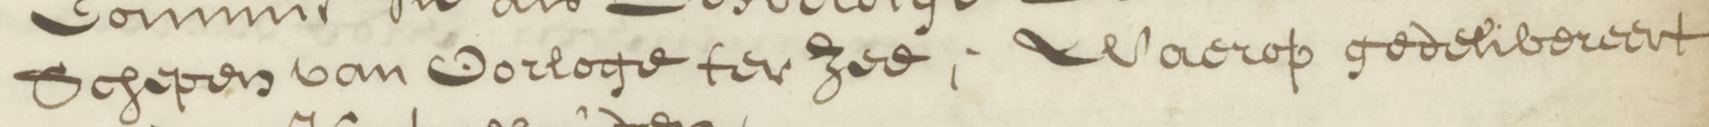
Schepen van Oorloge ter Zee; Waerop gedelibereert
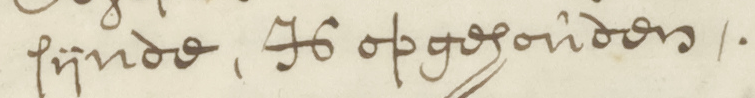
sijnde, Is opgehouden.
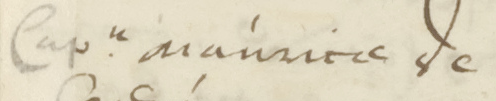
Capn. maurice de
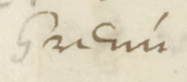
Grenu
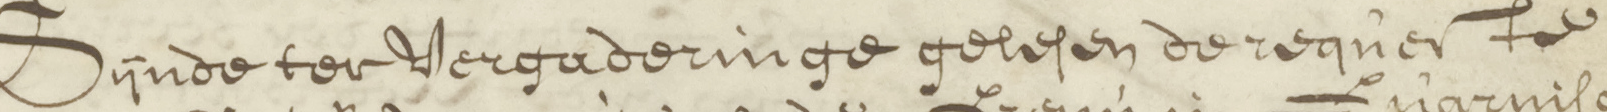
Sijnde ter Vergaderinge gelesen de requeste
